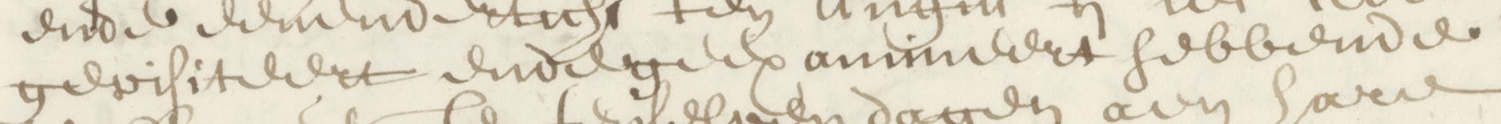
gevisiteert ende geexamineert hebbende
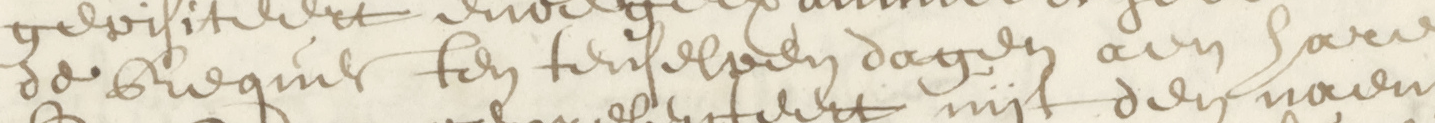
de Requesten tenselven dagen aen hare
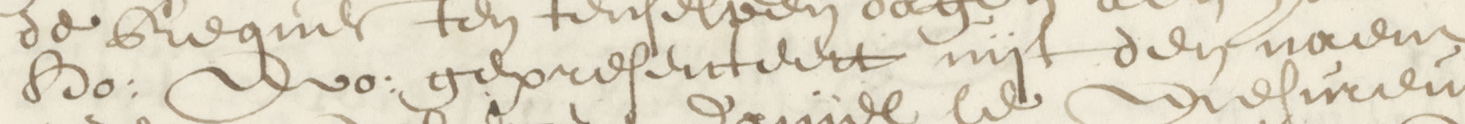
Ho:Mo: gepresenteert uijt den naem
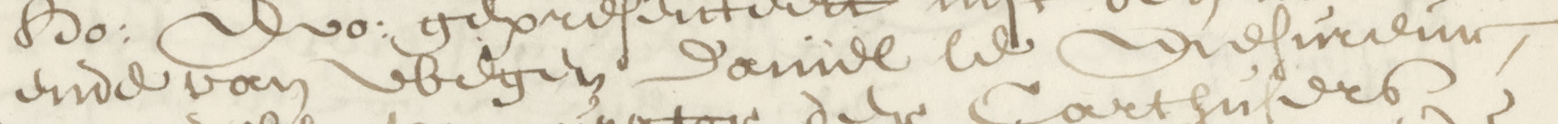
ende van wegen Daniel le Mesureur,
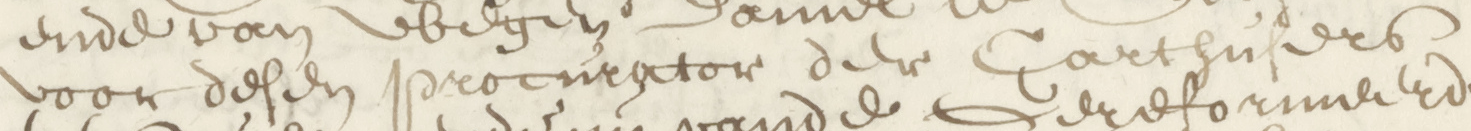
voor desen procurator der Carthusers
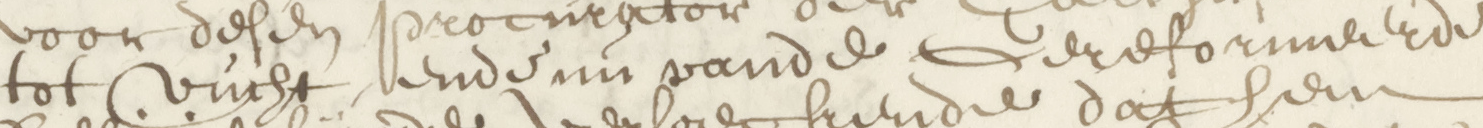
tot Vucht, ende nu vande Gereformeerde
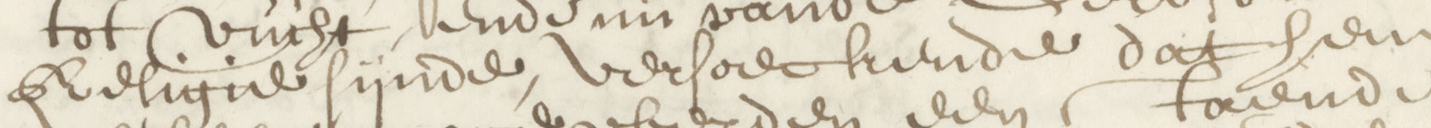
Religie sijnde, versoeckende dat hem
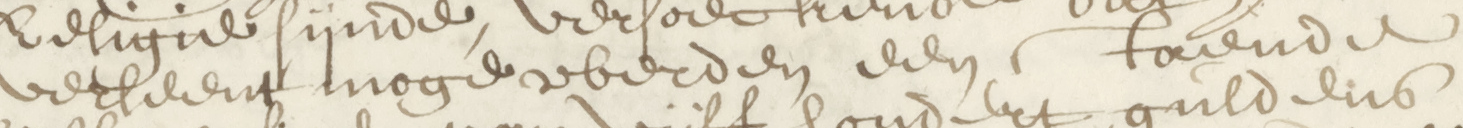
verleent moge werden een staende
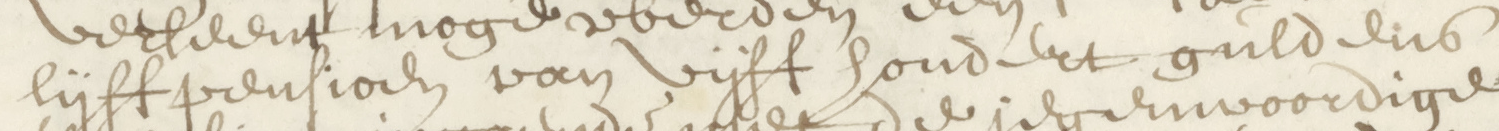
lijffpensioen van vijff hondert guldens
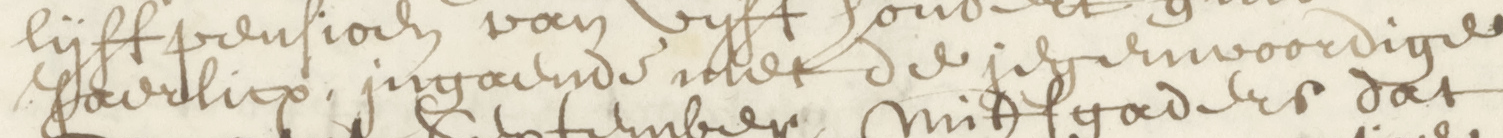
Jaerlicx, ingaende met de jegenwoordige
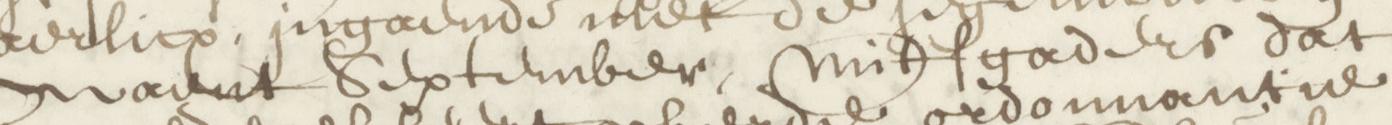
maent September, mitsgaders dat
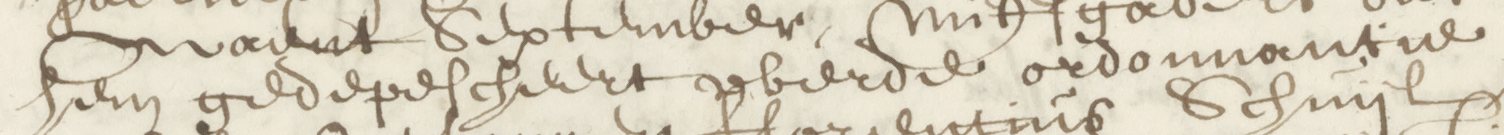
hem gedepescheert werde ordonnantie
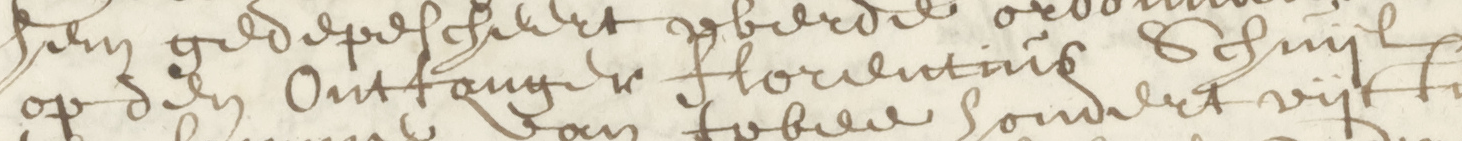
op den Ontfanger Florentius Schuijl,
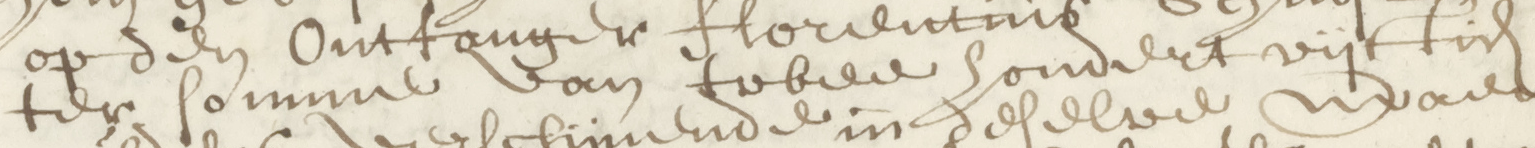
ter somme van twee hondert vijftich
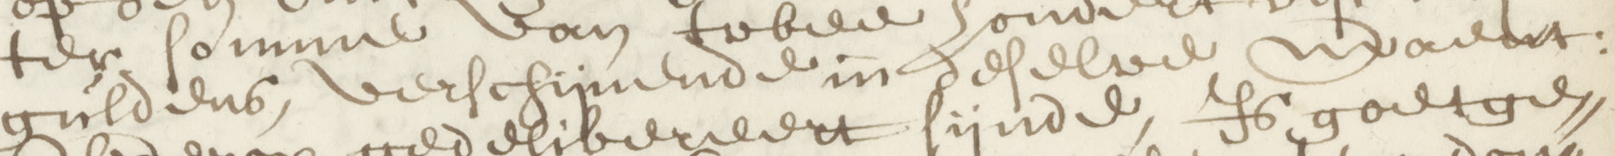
guldens, verschijnende in deselve maent:
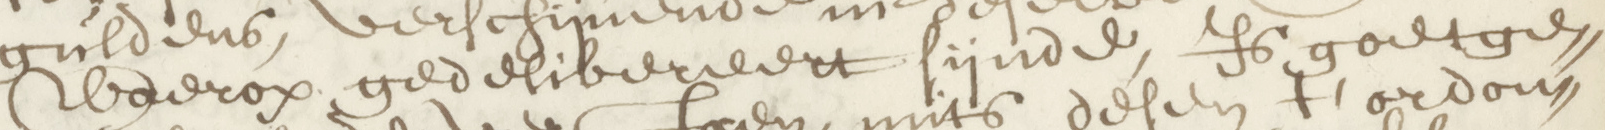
Waerop gedelibereert sijnde, Is goetge,,
